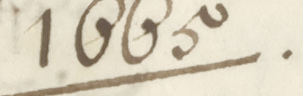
1665.
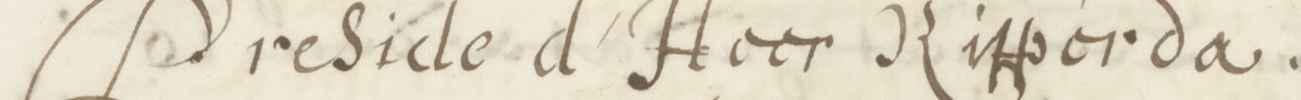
Preside d' Heer Ripperda.
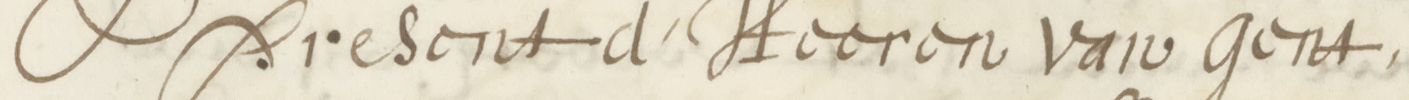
Present d'Heeren van Gent,
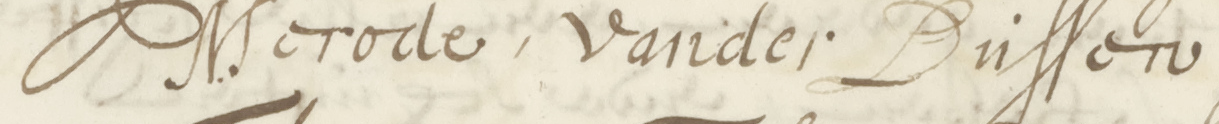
Merode, vander Dussen,
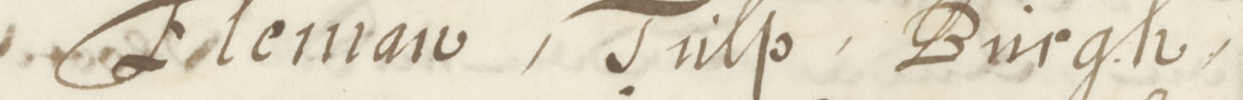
Fleman, Tulp, Burgh,
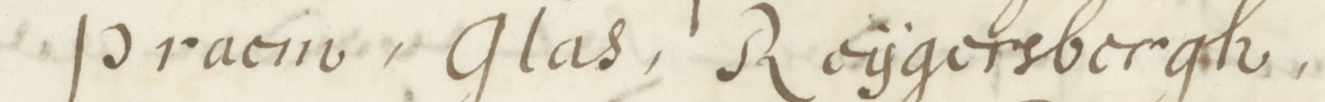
Praem, Glas, Reijgersbergh,
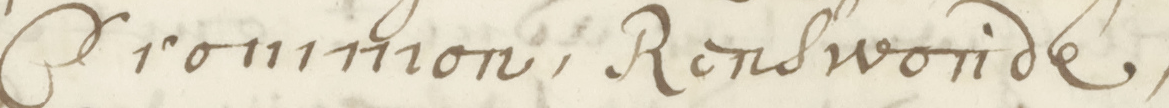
Crommon, Renswoude,
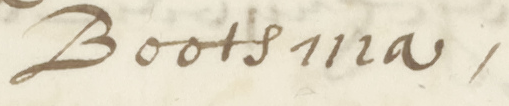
Bootsma.
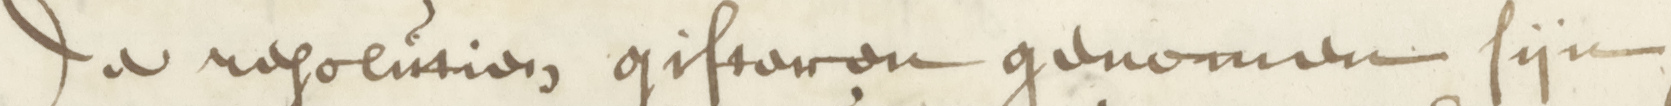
De resolutien gisteren genomen sijn
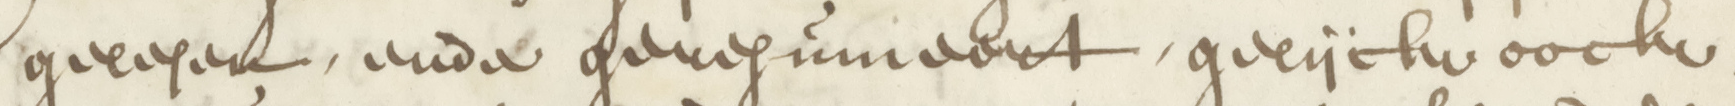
gelesen, ende geresumeert, gelijck oock.
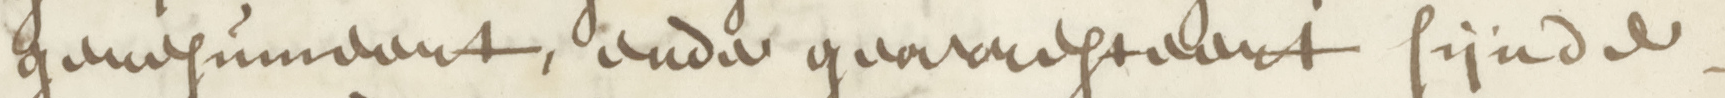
geresumeert, ende gearresteert sijn de,
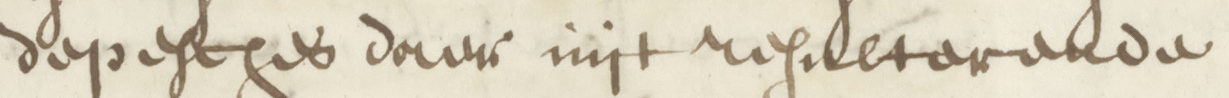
depesches daer uijt resulterende.
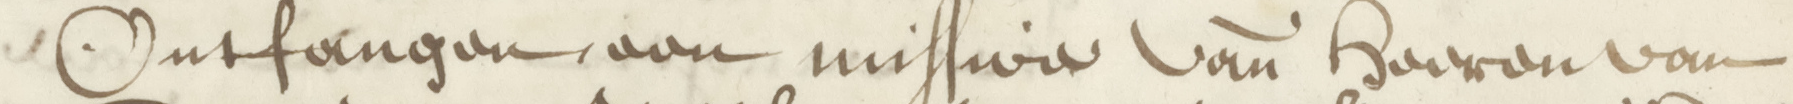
Ontfangen, een missive van Heeren van
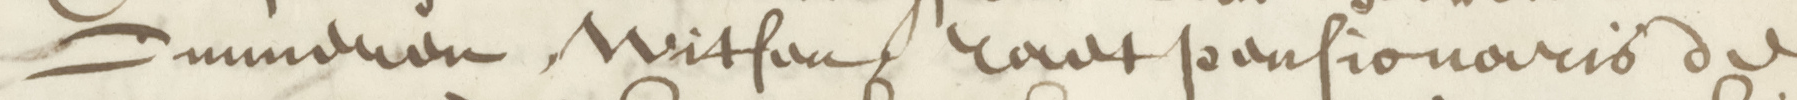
Ommeren, Witsen, raetpensionaris de
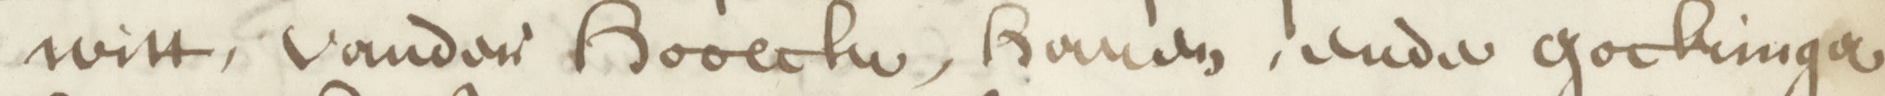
witt, vander Hoolck, Haren, ende Gockinga
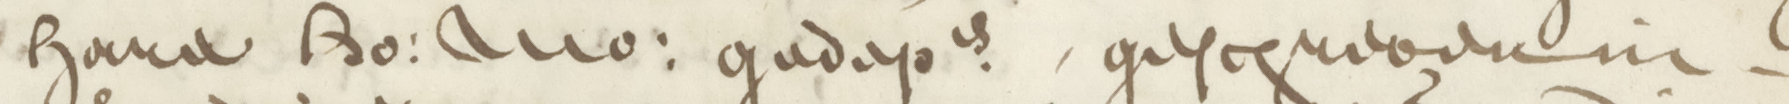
hare Ho:Mo: gedepen., geschreven in
